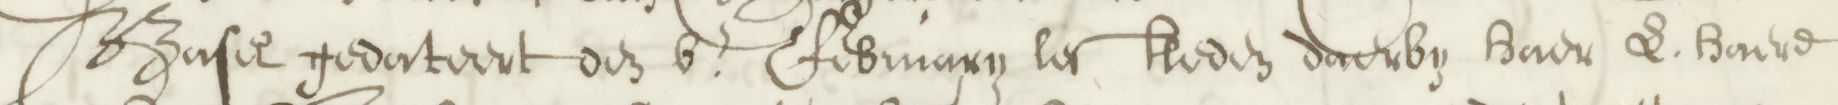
Basel gedateert den ve February lestleden daerby haer E. haere
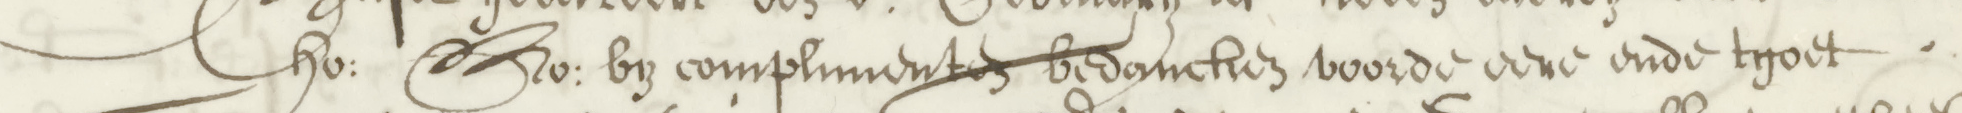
Ho:Mo: by complimenten bedancken voorde eere ende tgoet
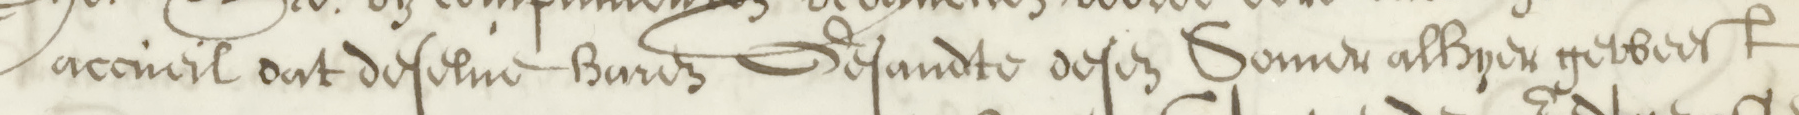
accueil dat deselue haren Gesandte desen Somer alhyer geweest
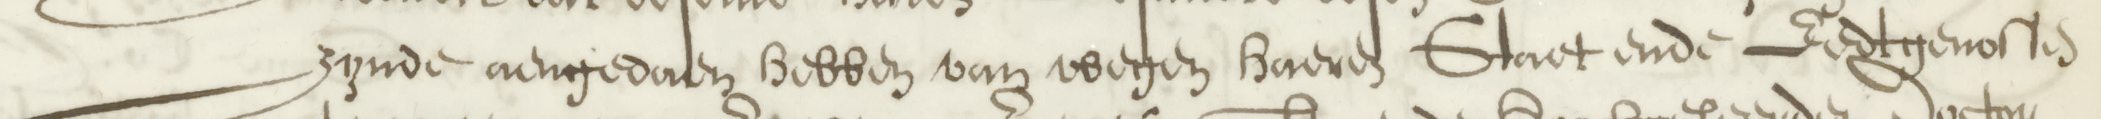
zynde aengedaen hebben van wegen haeren Staet ende Eedtgenossen
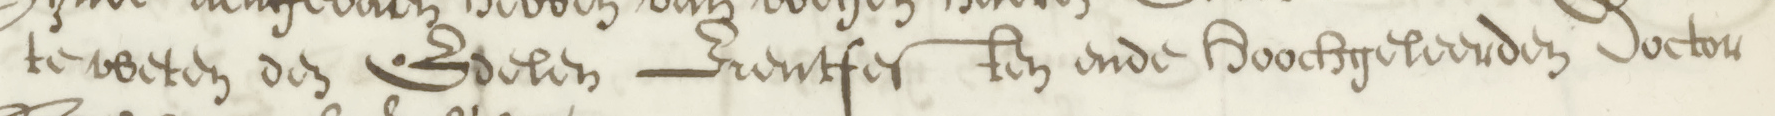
te weten den Edelen Erentfesten ende hoochgeleerden Doctor
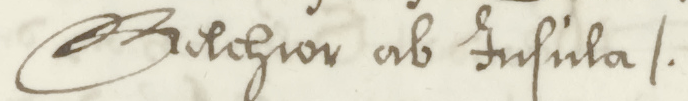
Melchior ab Insula.
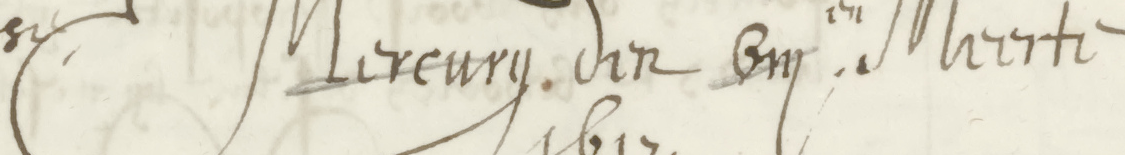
Mercury den viiien Meerte
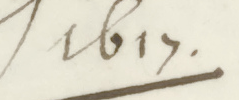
1617
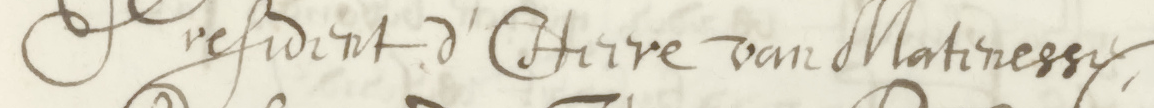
President d'Heere van Matenesse
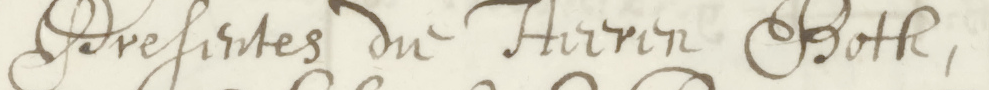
Presentes die Heeren Both,
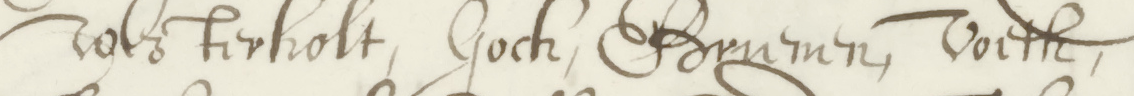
Westerholt, Goch, Brienen, Voeth,
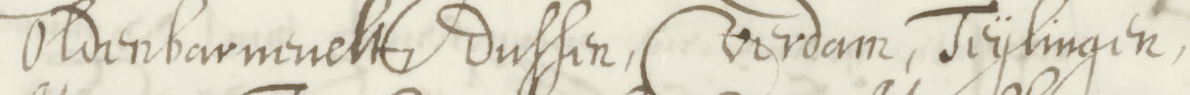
Oldenbarnevelt, Dussen, Verdam, Teijlingen,
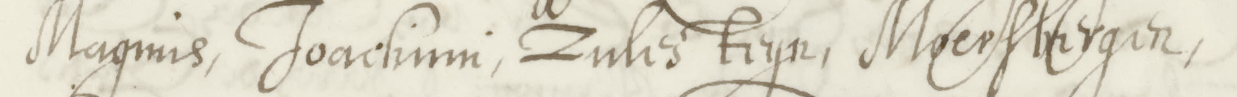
Magnis, Joachimi, Zulesteyn, Moersbergen,
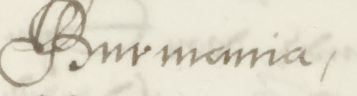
Burmania
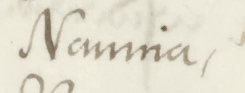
Nannia
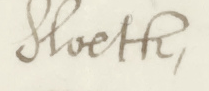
Sloeth,
